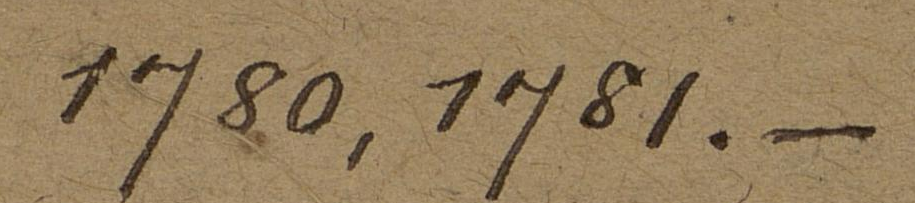1780,1761.-
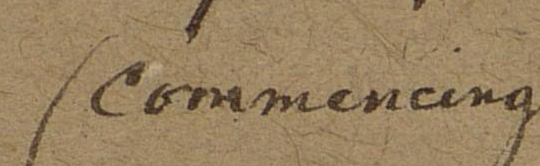(Commencing
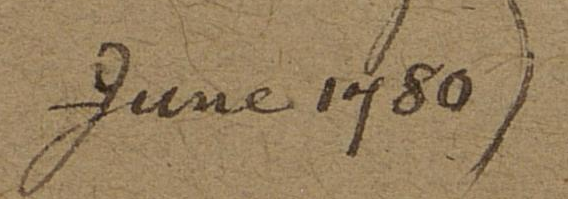June 1780)
